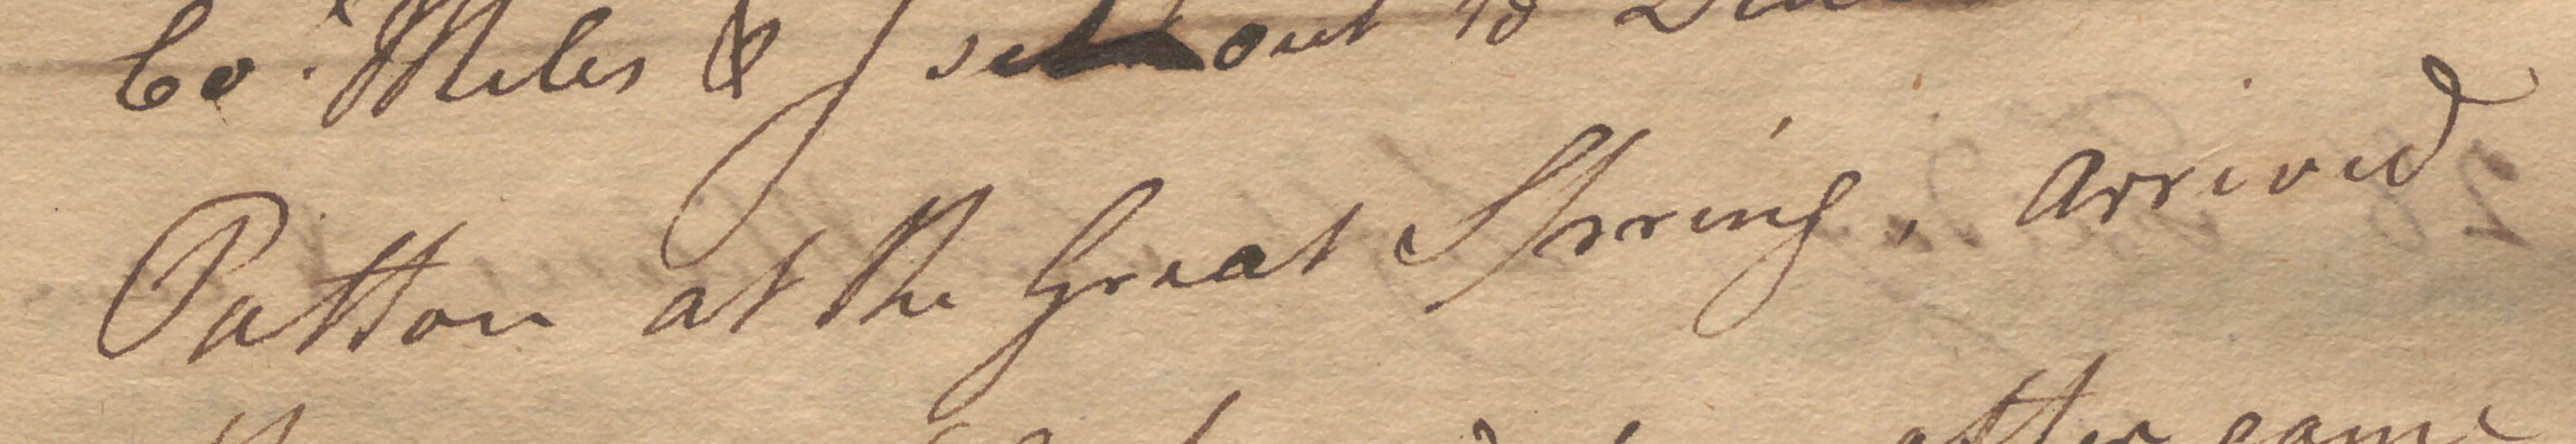Patton at the Great Spring. Arrived
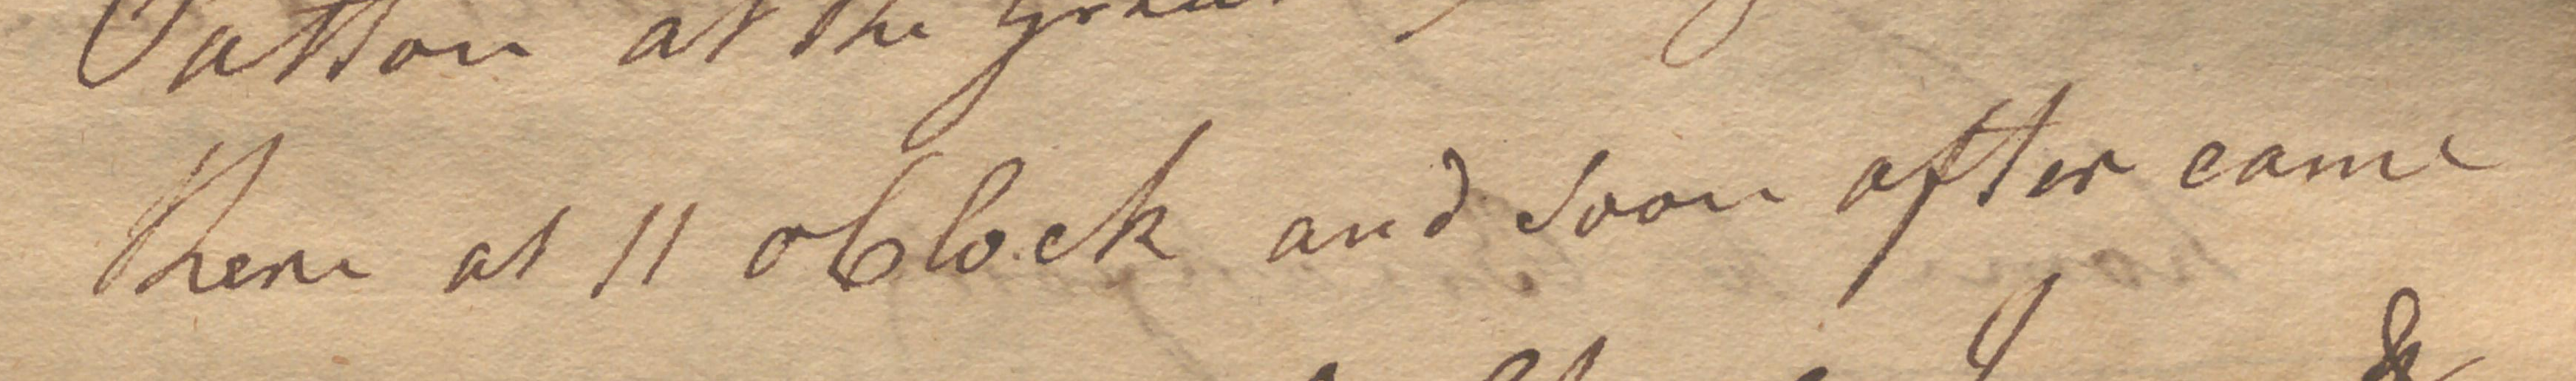there at 11 oClock and soon after came
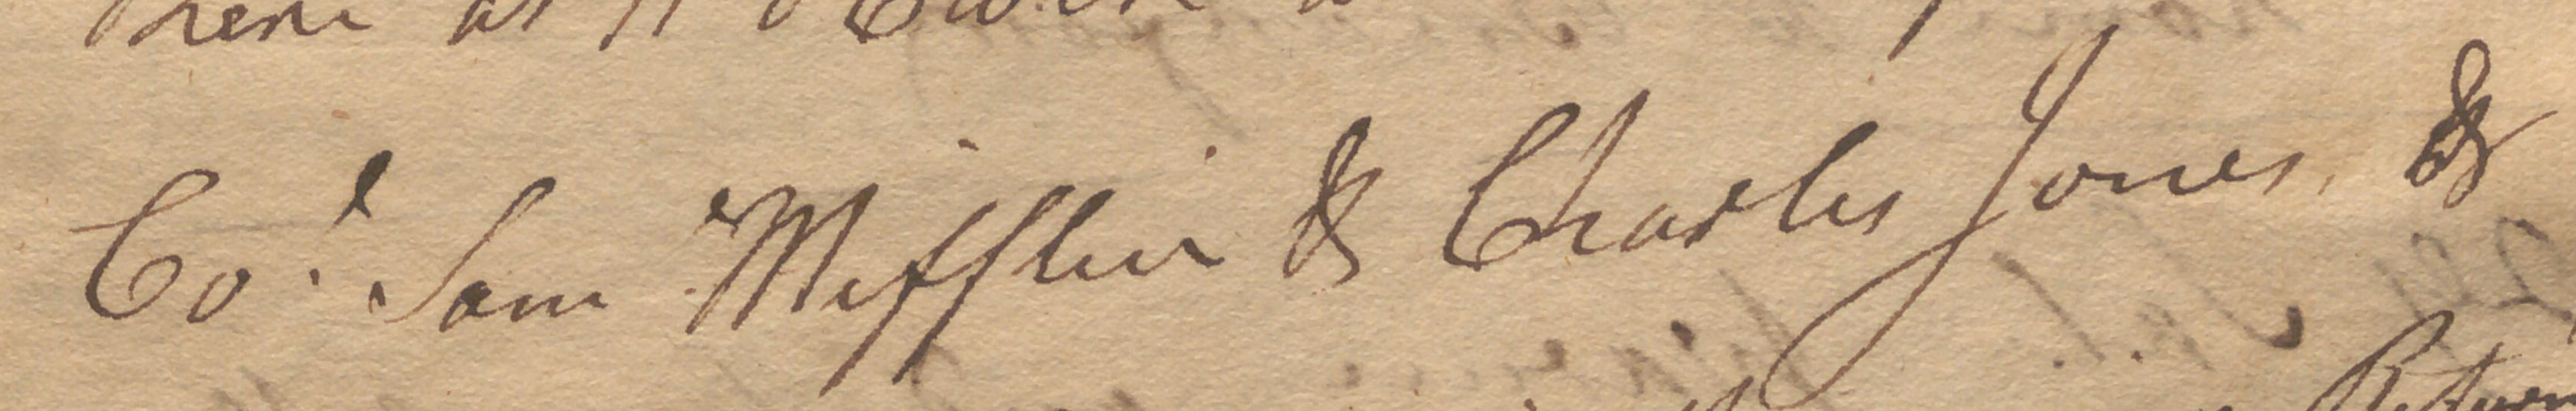Co^l. Samr Mifflin & Charles Jones &
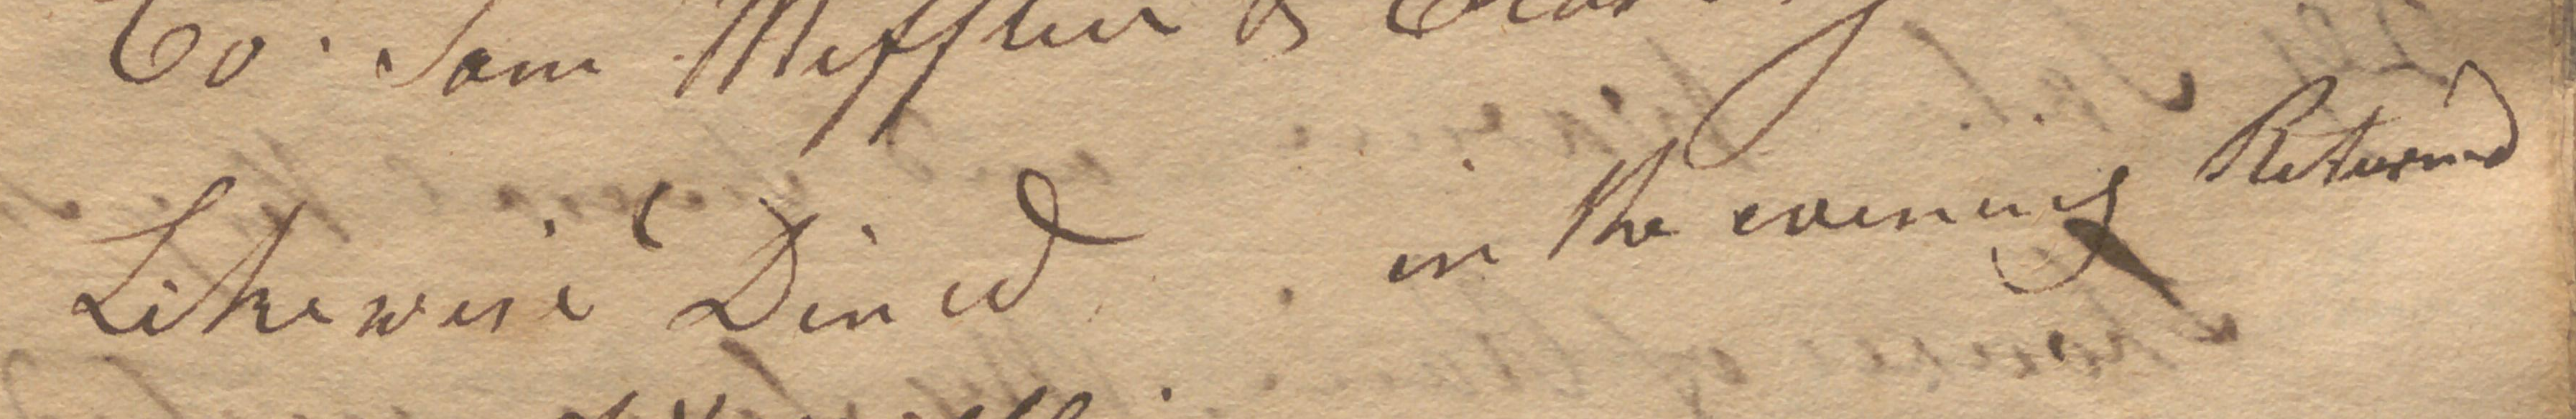Likewise Dined- in the evenueg Returned
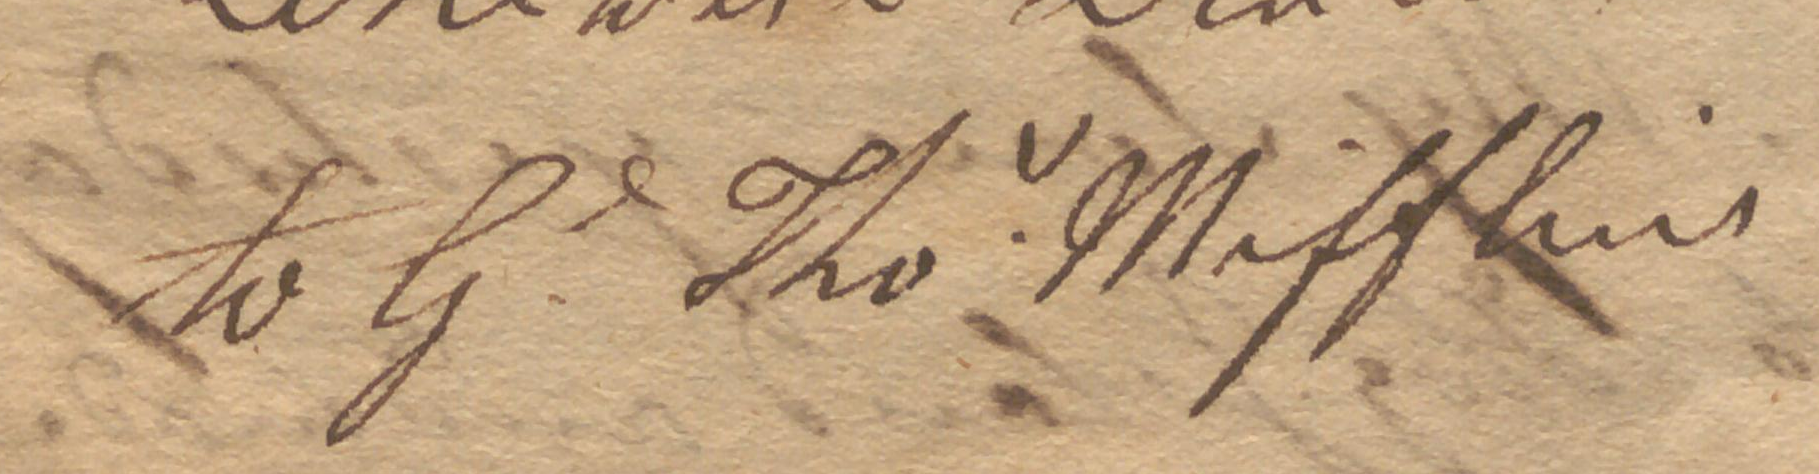to G^l. Tho^s Mifflins
